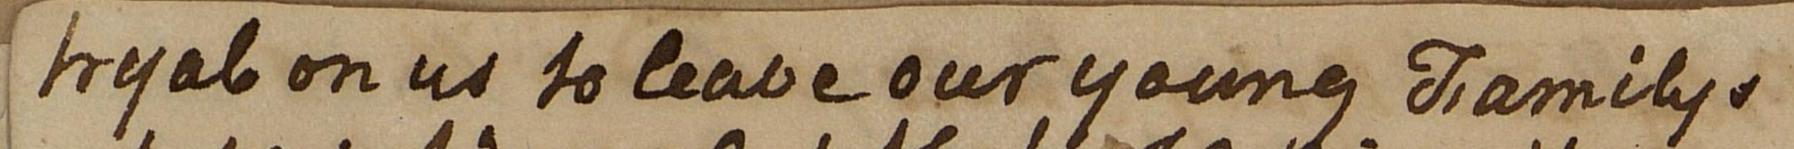tryal on us to leave our young Familys
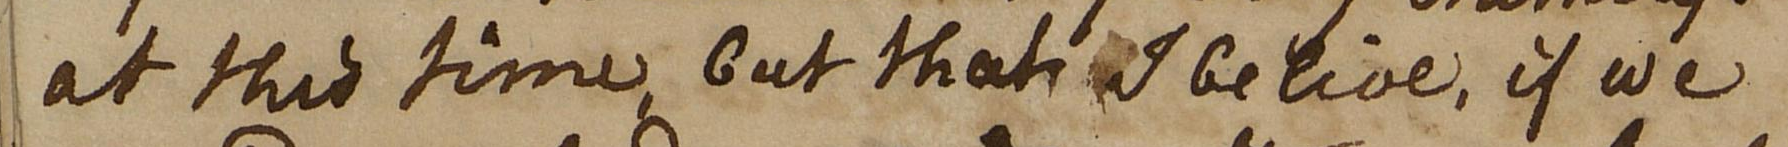at this time, but that I belive, if we
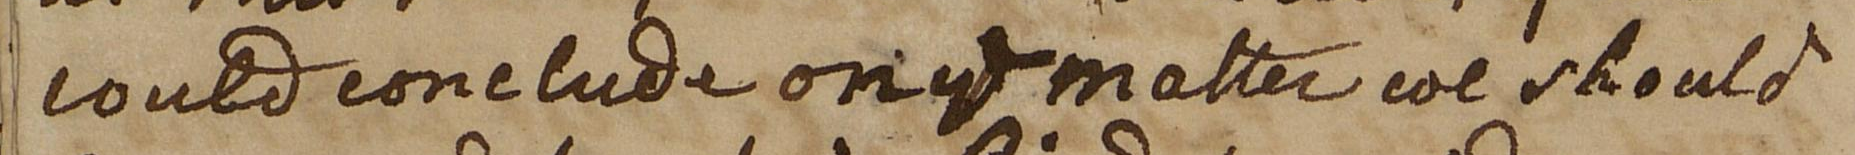could conclude on y^e matter we should
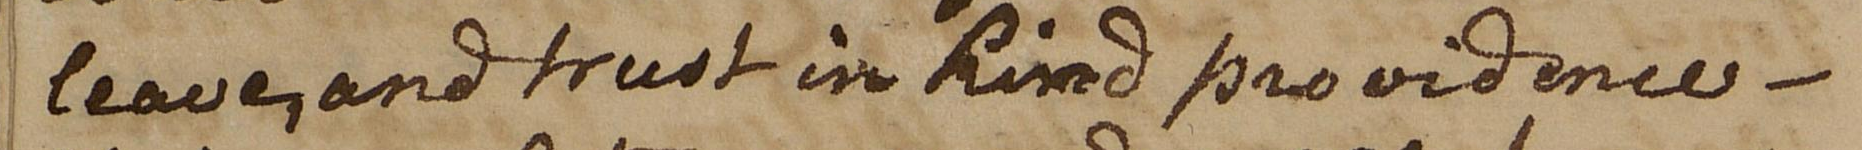leave, and trust in kind providence-
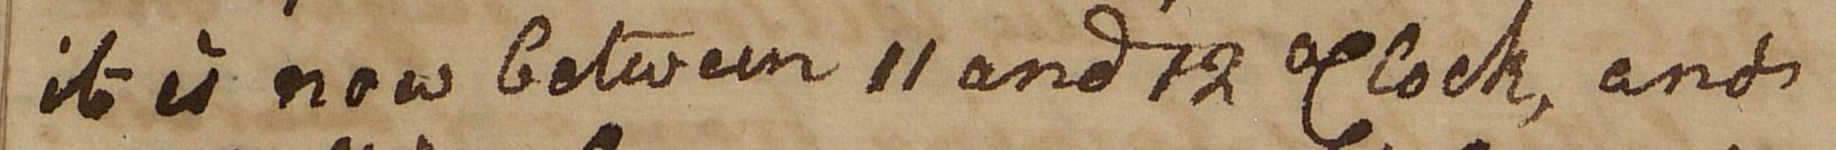it is now between 11 and 12 ^o Clock, and
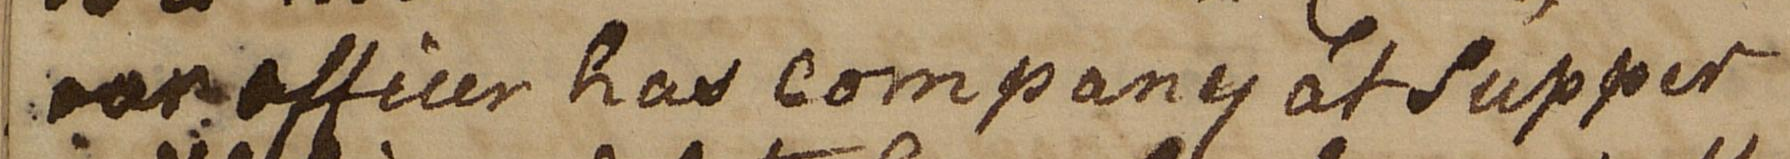an officer has company at Supper
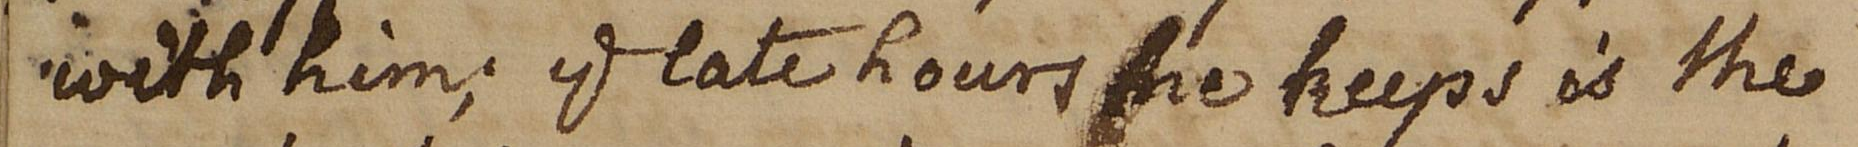with him; y^e late hours he keeps is the
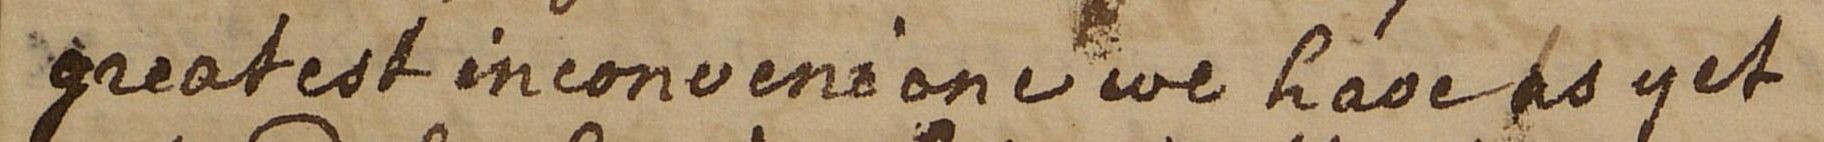greatest inconvenience we have as yet
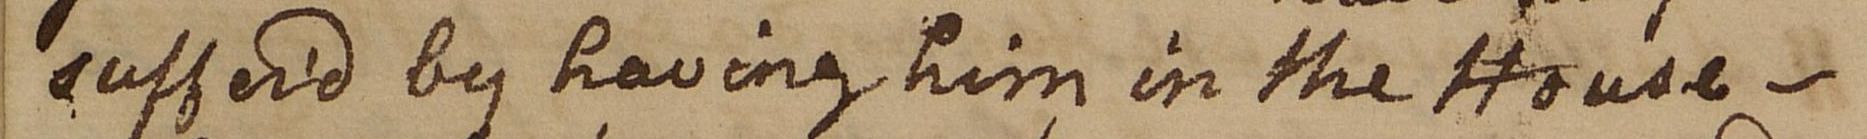suffer'd by having him in the House-
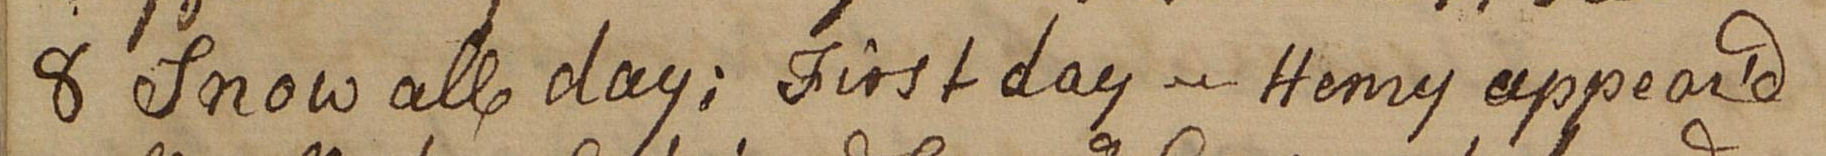8 Snow all day; First day- Henry appear'd
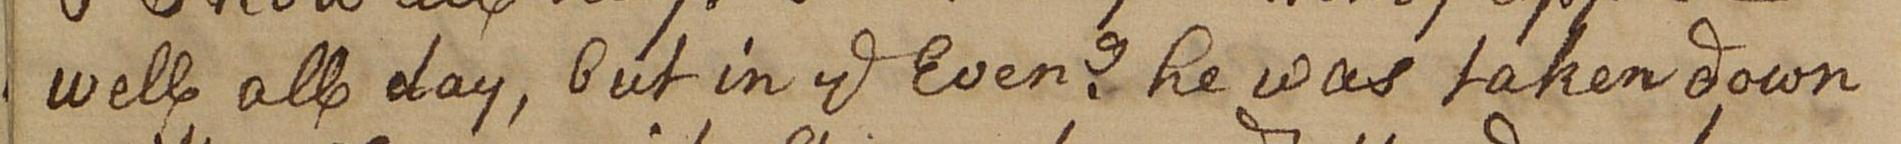well all day, but in y^e Even^g. he was taken down
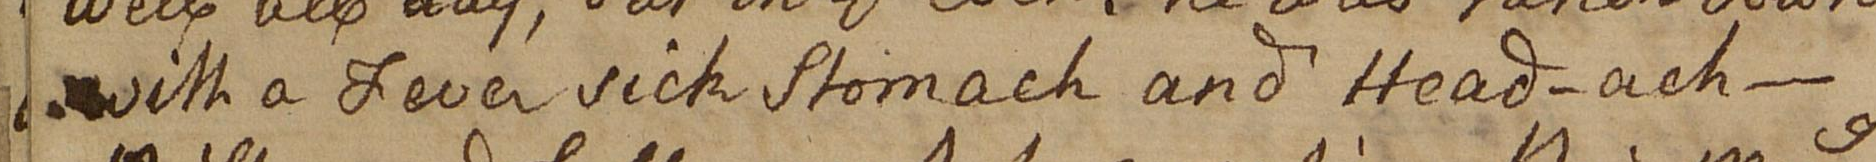with a Fever sick stomach and Head-ach-
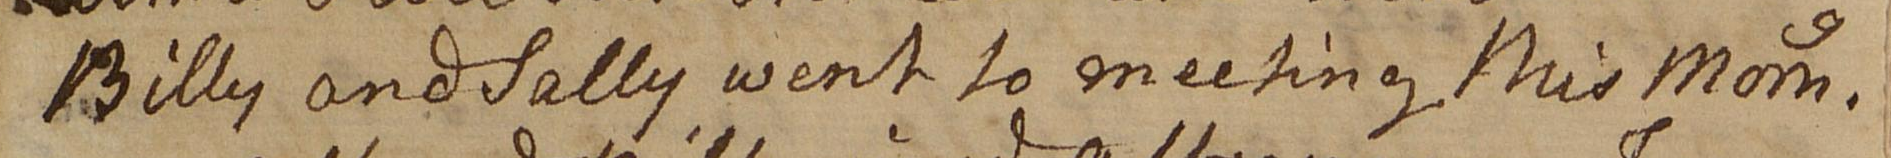Billy and Sally went to meeting this Morn^g.
